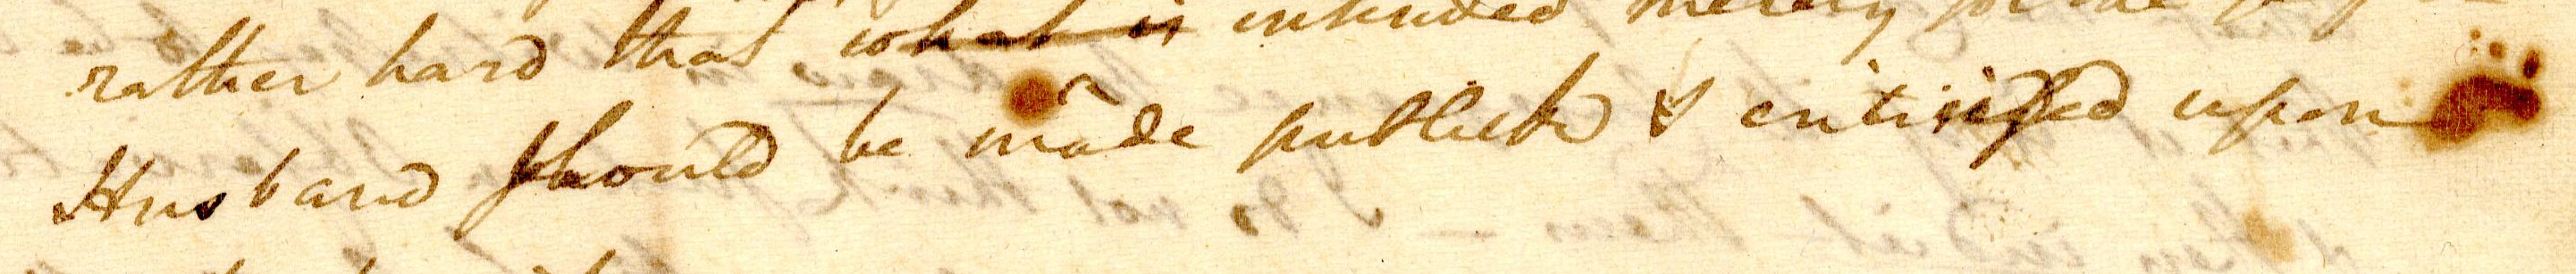Husband should be made publick & intruded upon
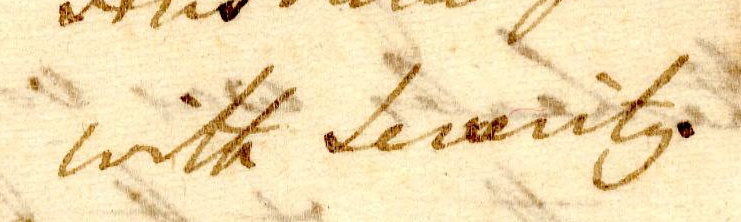with severity.
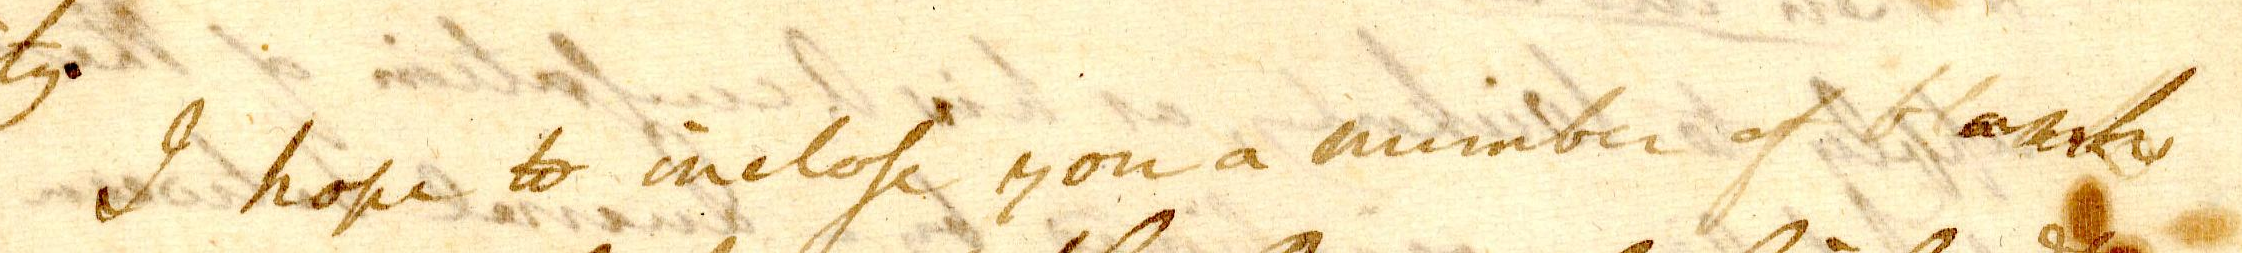I hope to inclose you a member of blank
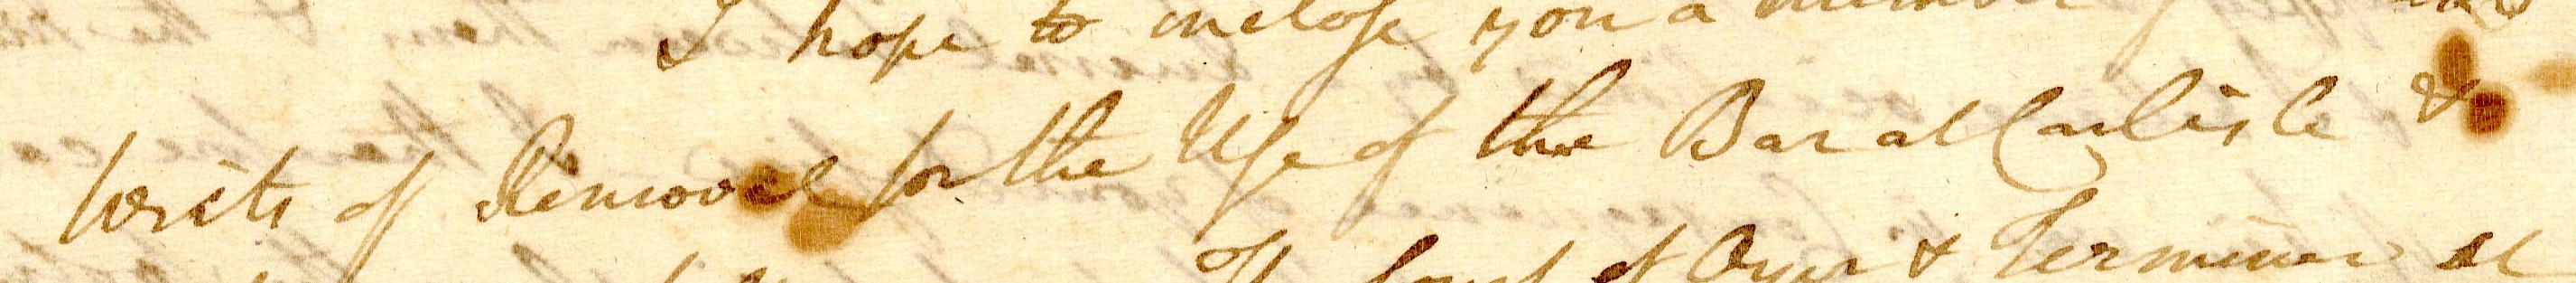Writs of Removal for the Use of the Bar at Carlisle &
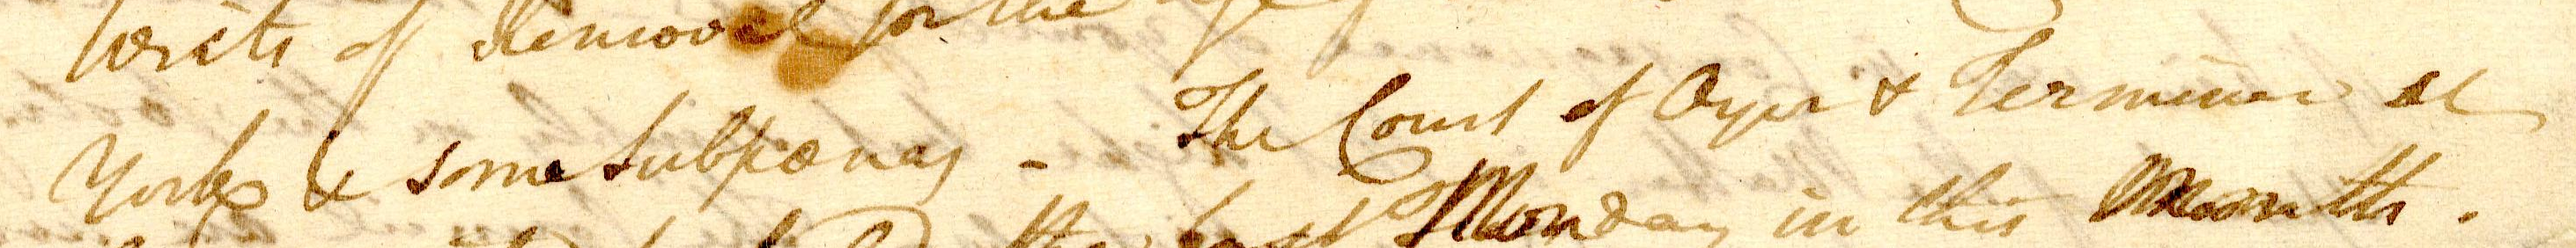York & some subponas. The Court of Oyer & Terminar at
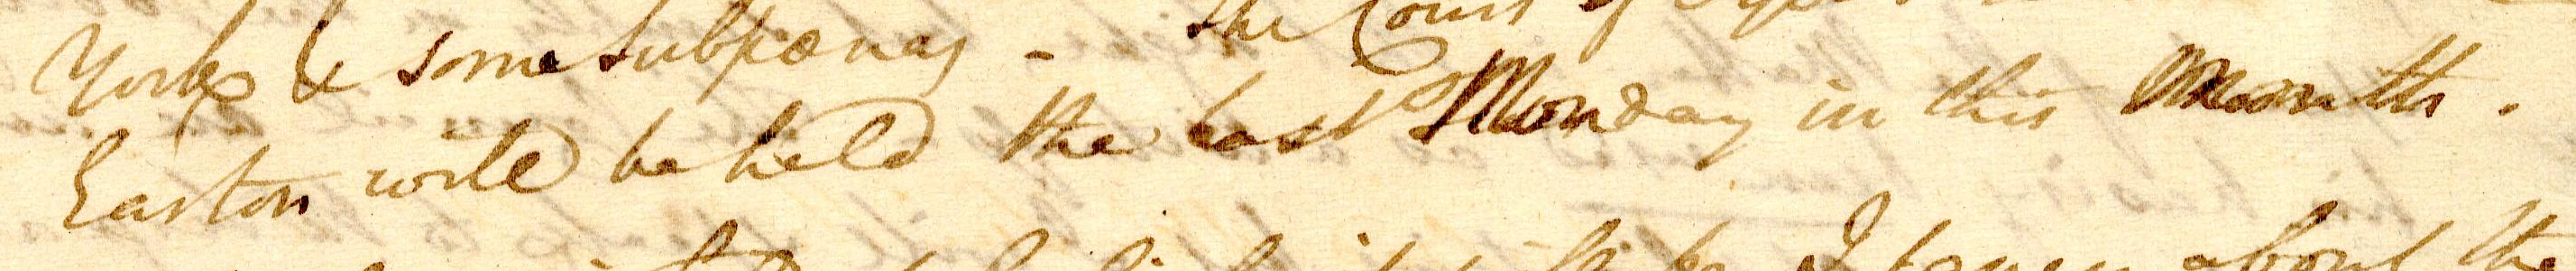Easton will be held the last Monday in this Month.
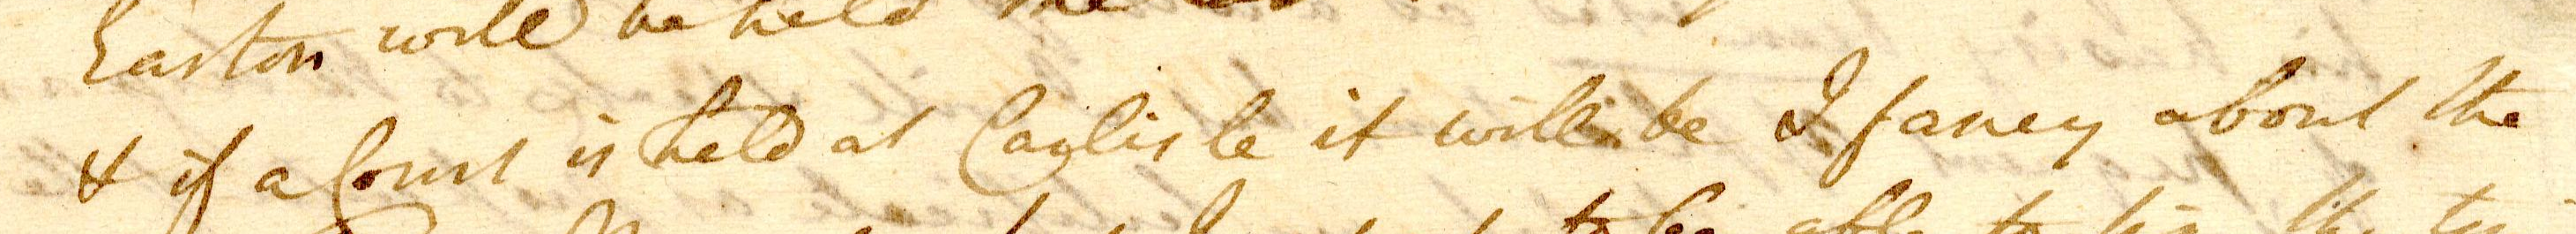& if a Court is held at Carlisle it will be I fancy about the
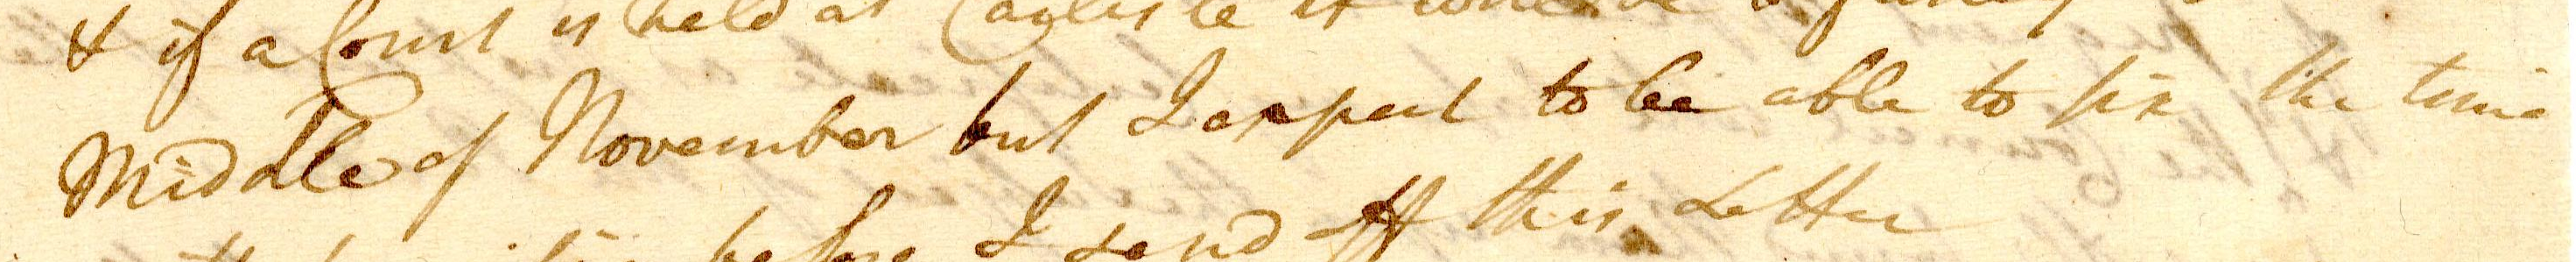Middle of November but I appeal to be able to fix the time
